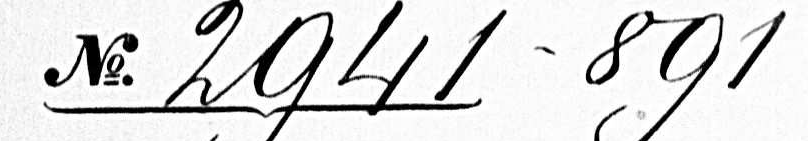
No. 2941 - 1891
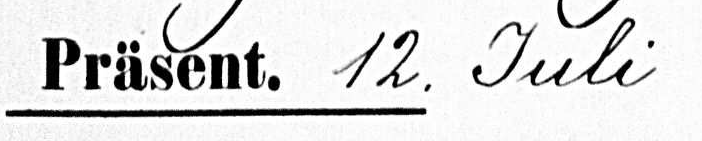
Präsent. 12. Juli
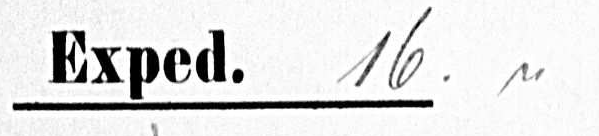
Exped. 16. „
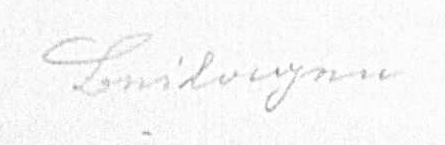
Beilagen
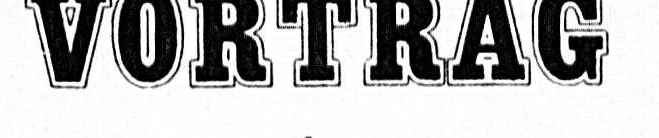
VORTRAG
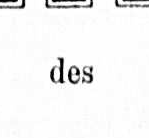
des
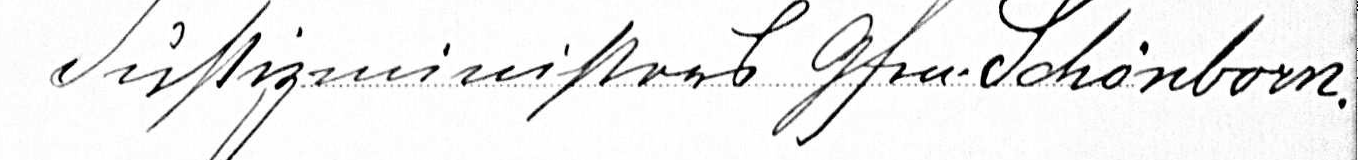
Justizministers Grafen Schönborn
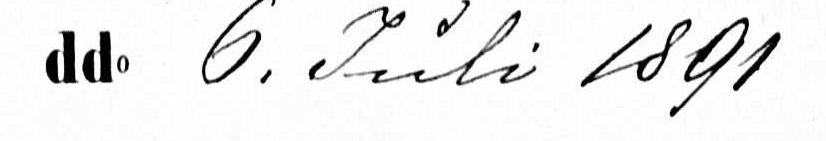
ddo 6. Juli 1891
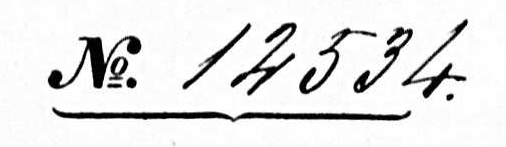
No. 12534
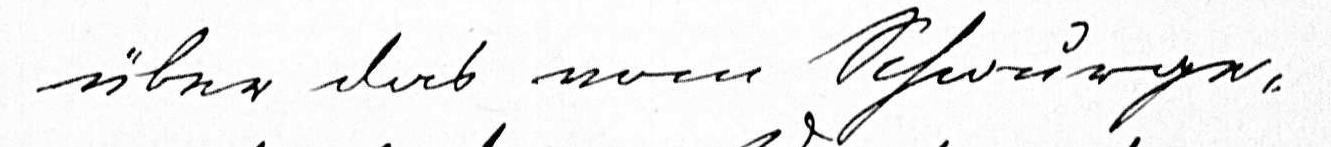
Über das vom Schurge¬
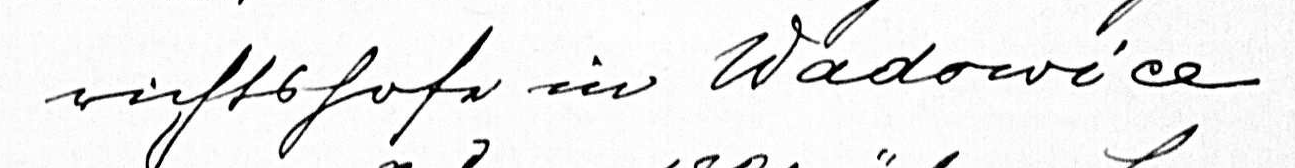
richtshofe in Wadowice
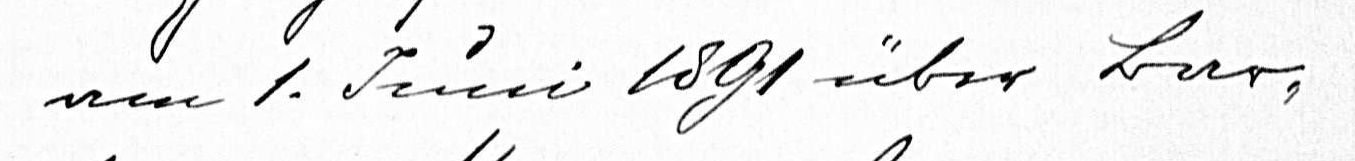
am 1. Juni 1891 über Bar¬
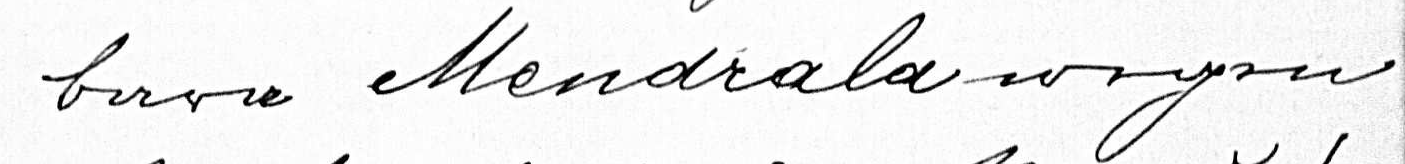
bara Mendrala wegen
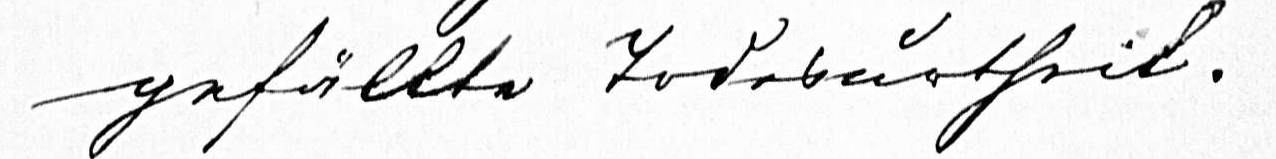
gefällte Todesurtheil.
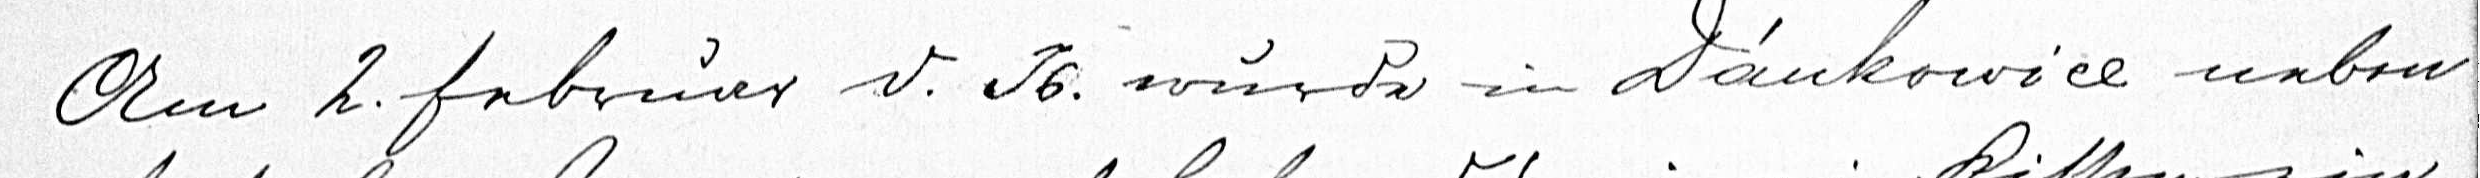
Am 2 Februar d. Js. wurde in Dánkowice neben
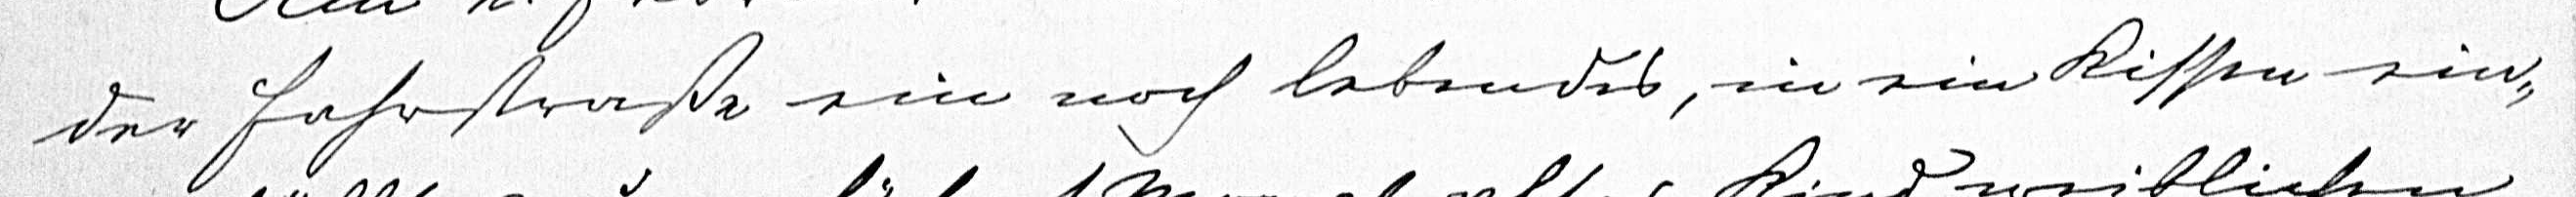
der Fahrstraße ein noch lebendes, in ein Kissen ein¬
